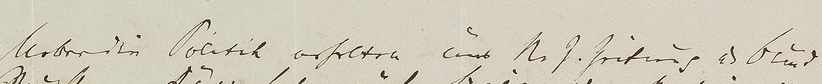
Ueber Politik erhalten uns N. Z. Zeitung u. Bund
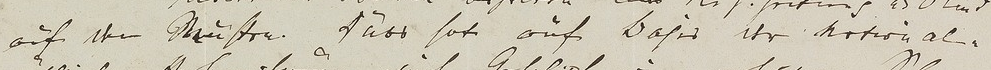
auf dem Neusten. Dubs hat auf Basis der national-
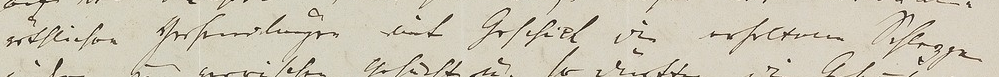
räthlichen Verhandlungen mit Geschick die erhaltene Schlappe
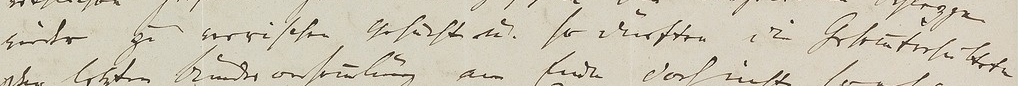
wieder zu verwischen gesucht u. so dürften die Gesammtresultate
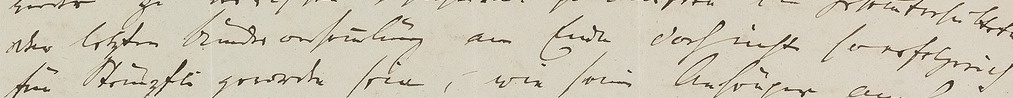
der letzten Bundesversammlung am Ende doch nicht so erfolgreich
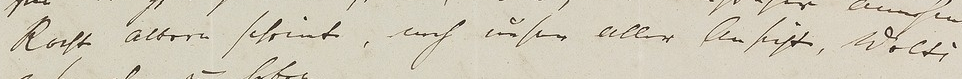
Recht albern scheint, nach unser aller Ansicht, Welti
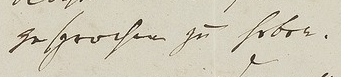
gesprochen zu haben.
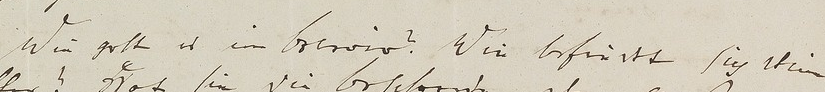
Wie geht es im Belvoir? Wie befindet sich deine
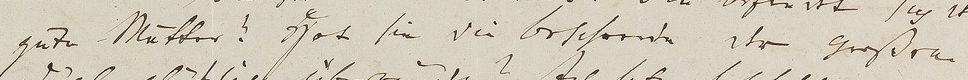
gute Mutter? Hat sie die Beschwerde der großen
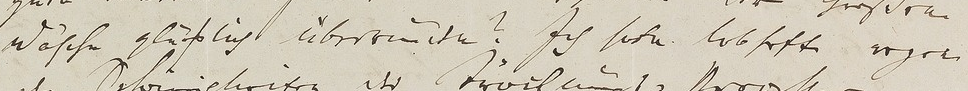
Wäsche glücklich überwunden? Ich habe lebhaft wegen
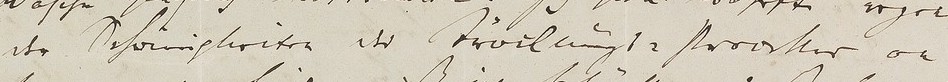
der Schwierigkeiten des Trocknungs–Processes an
